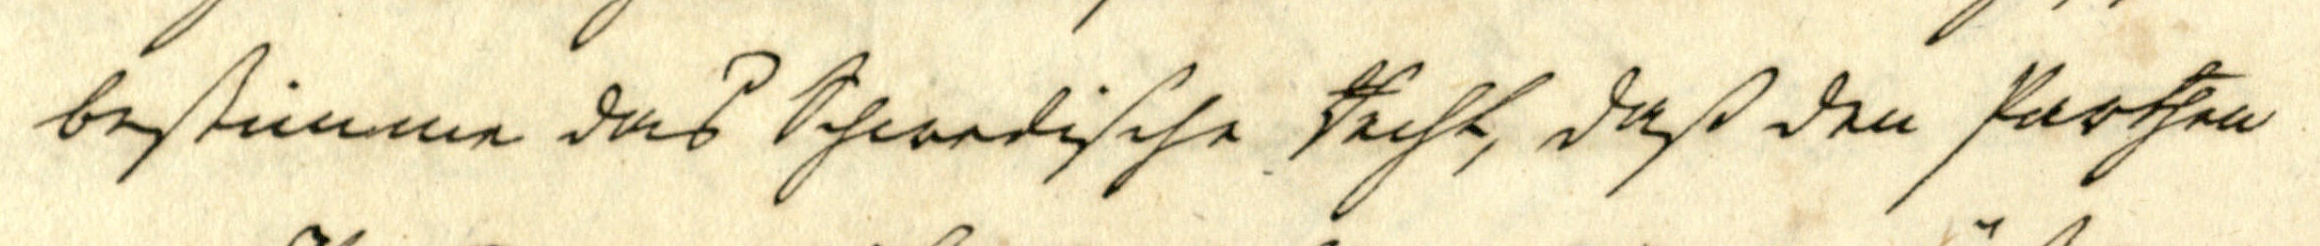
bestimme das Schwedische Recht, daß den Parthen
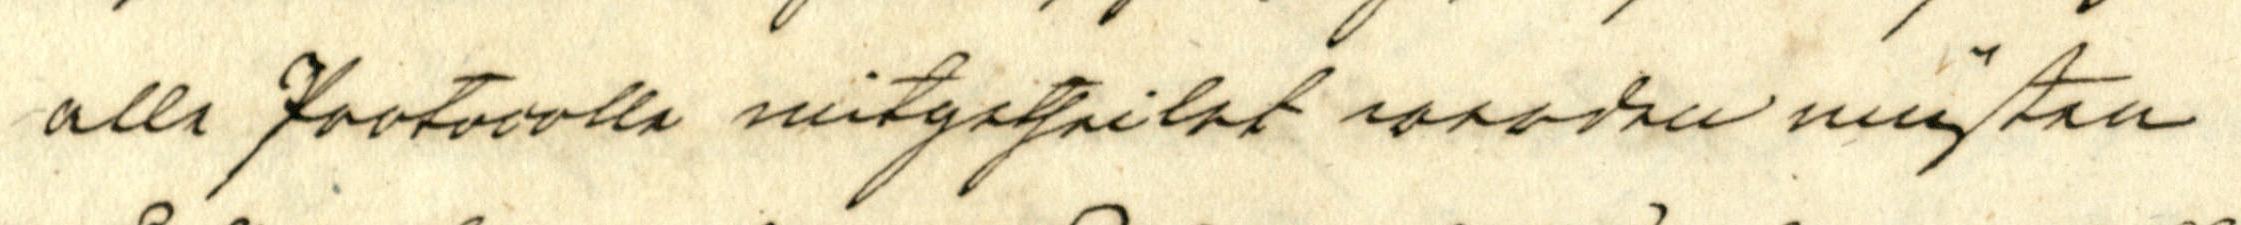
alle Protocolle mitgetheilet werden müßten
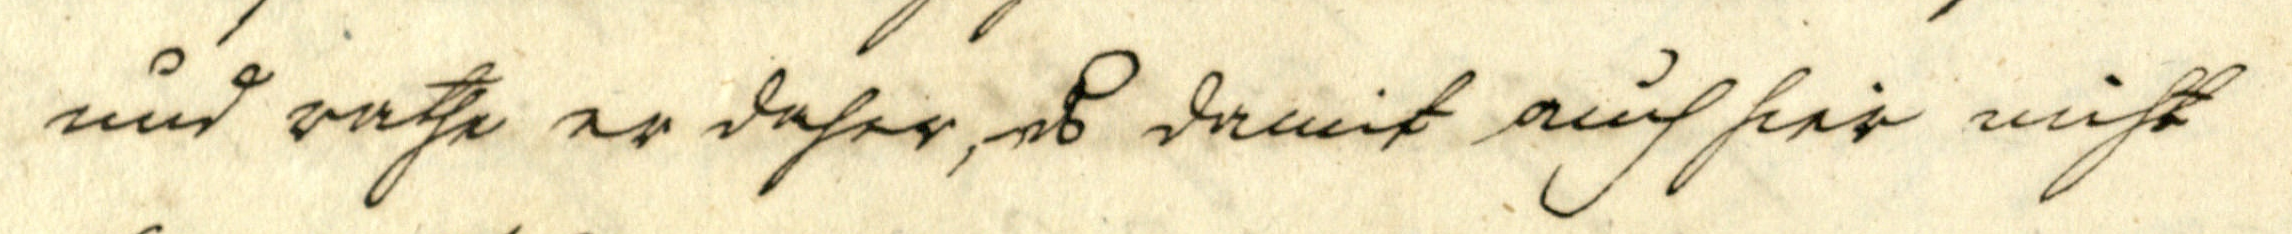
und rathe er daher, es damit auch hier nicht
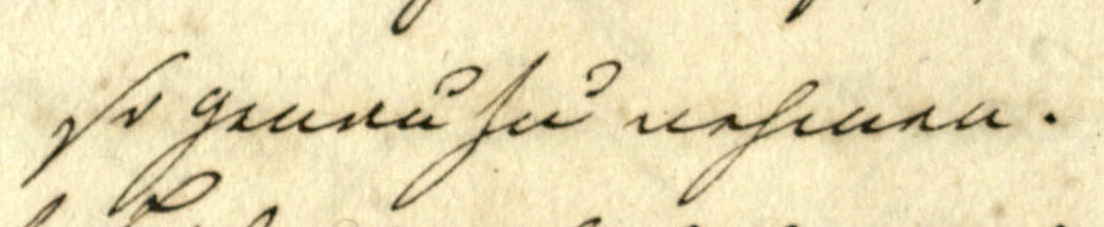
so genau zu nehmen.
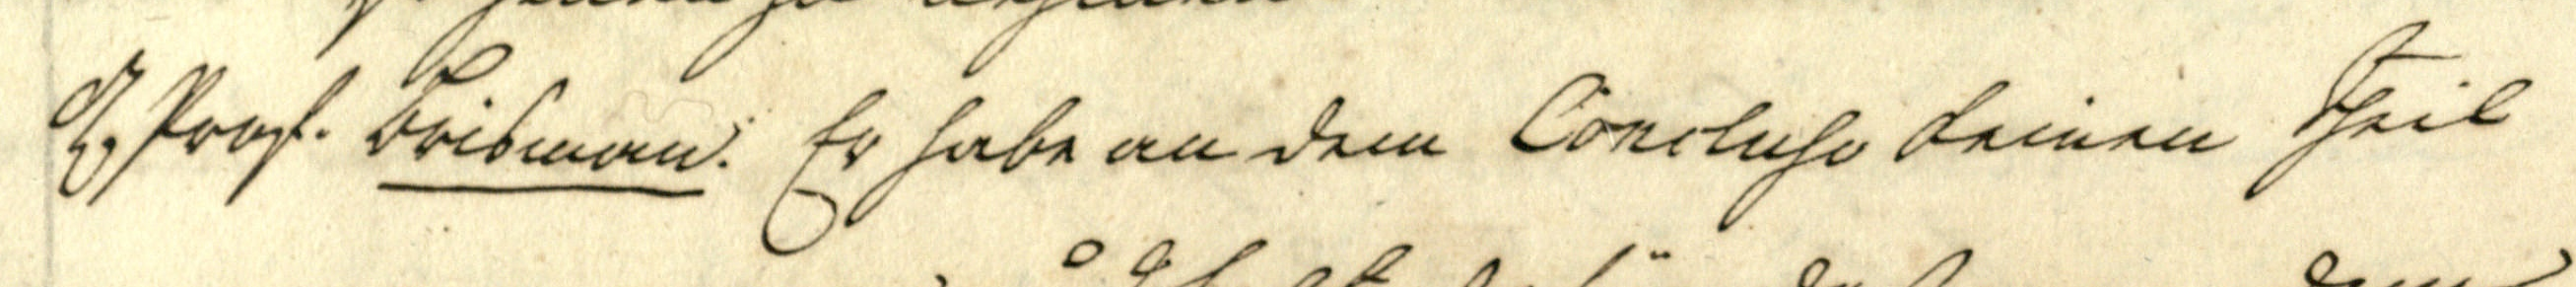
dh. Prof. Brisman. Er habe an dem Concluso keinen Theil
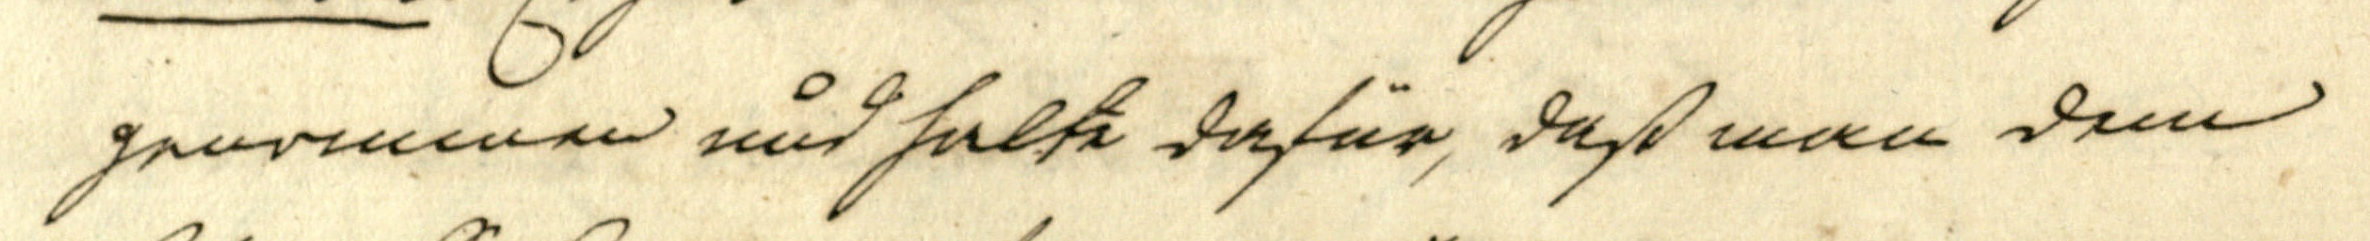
genommen und halte dafür, daß man dem
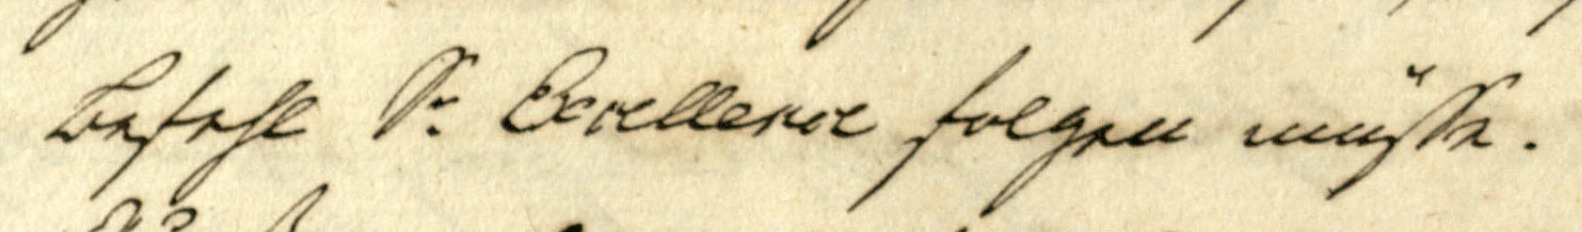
Befehl Sr. Excellence folgen müsse.
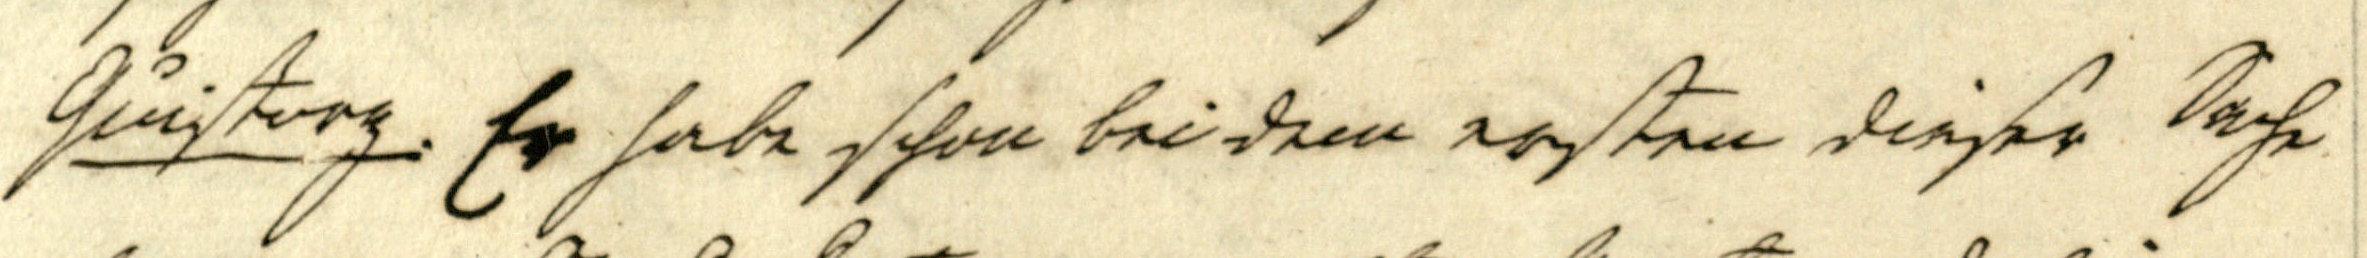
Quistorp. Er habe schon bei dem ersten dieser Sache
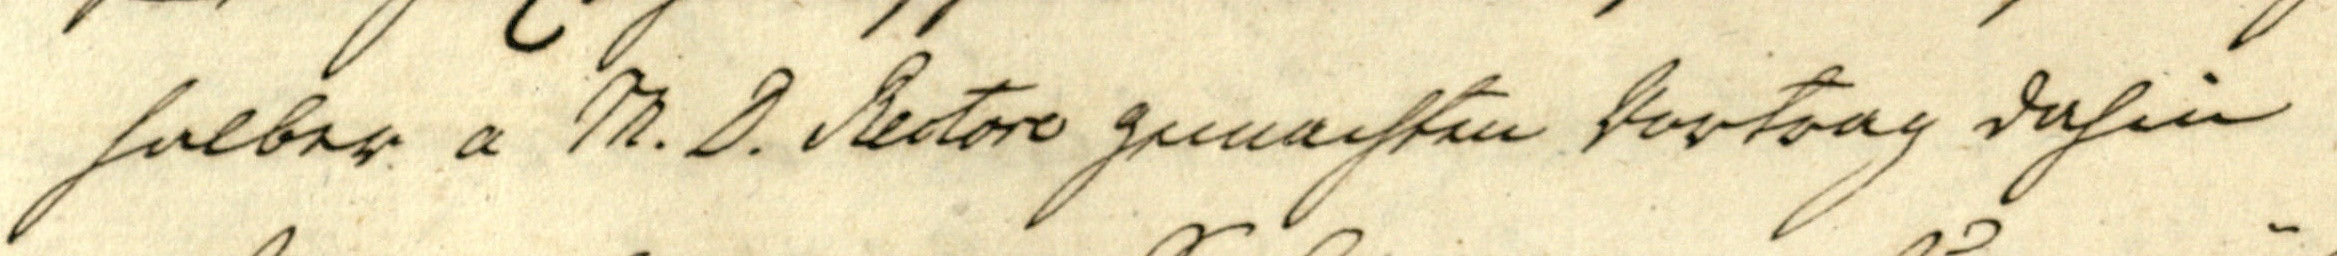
halber a M. D. Rectore gemachten Vortrag dahin
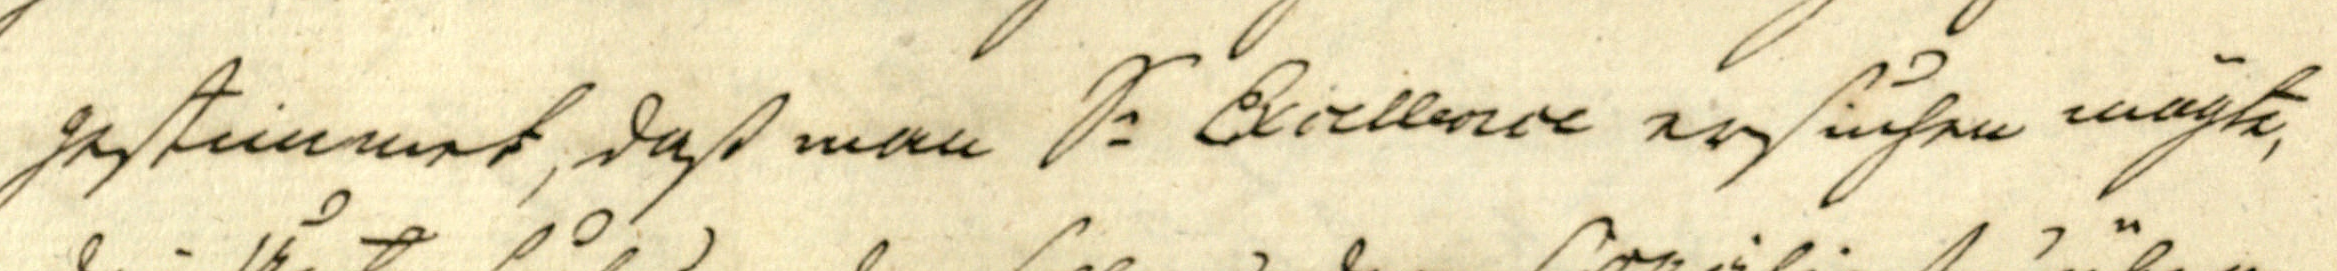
gestimmt, daß man Sr Excellence ersuchen mögte
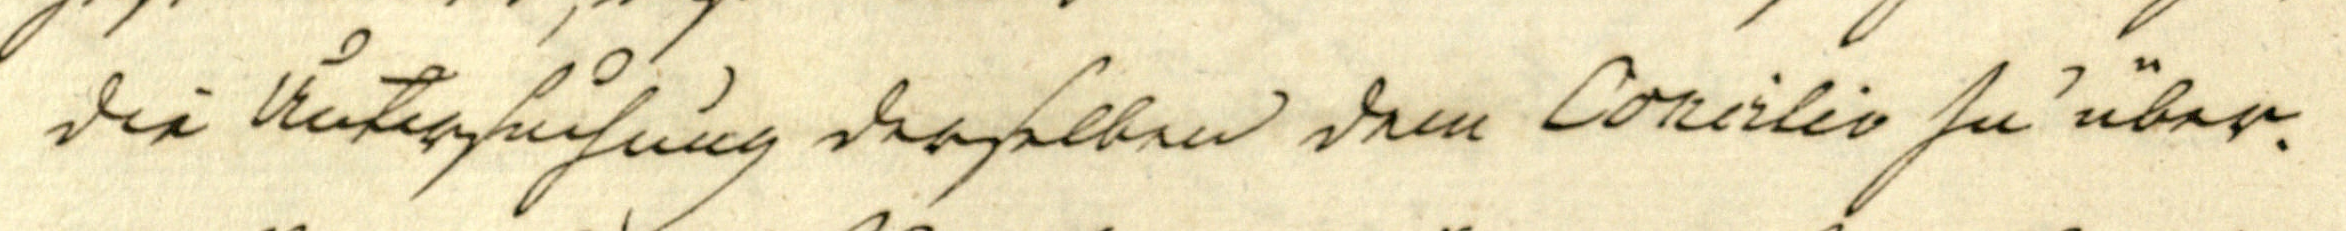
die Untersuchung derselben dem Concilio zu über¬
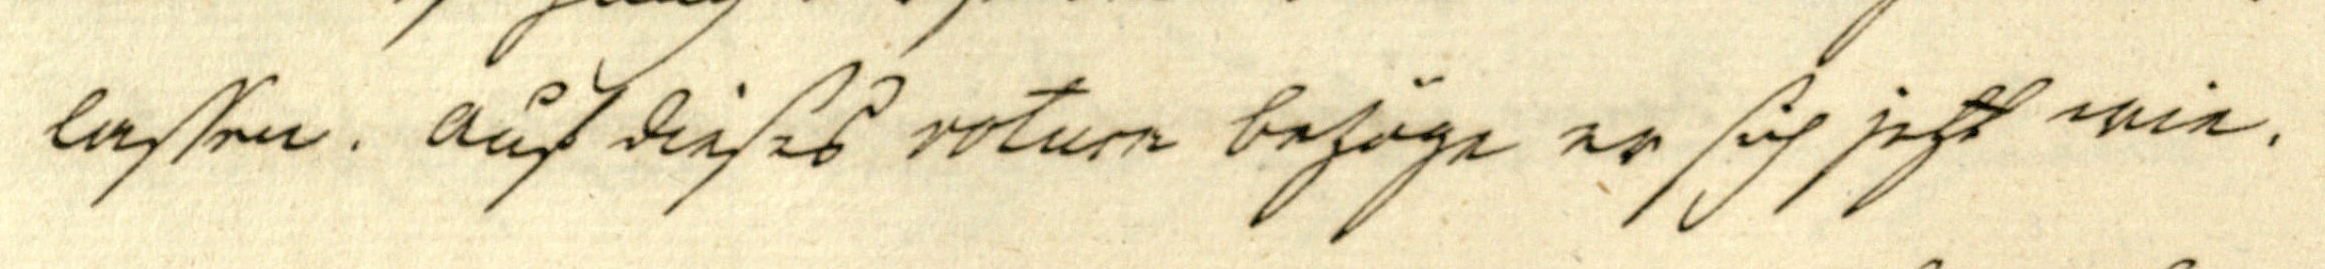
lassen. Auf dieses votum bezöge er sich jetzt wie¬
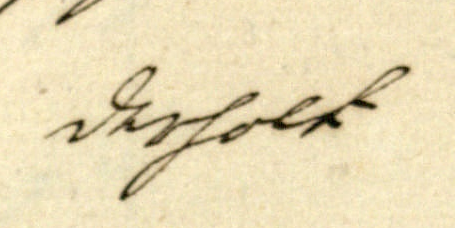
derholt
